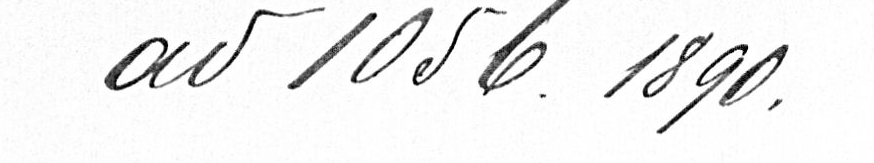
ad 1056. 1890.
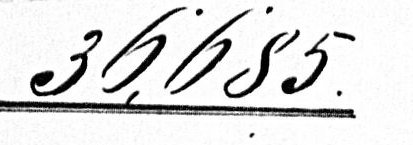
36,685.
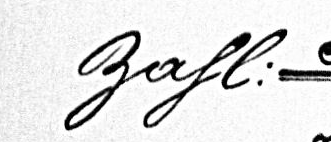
Zahl:
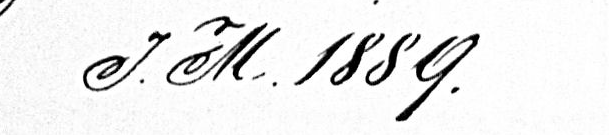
J. M. 1889.
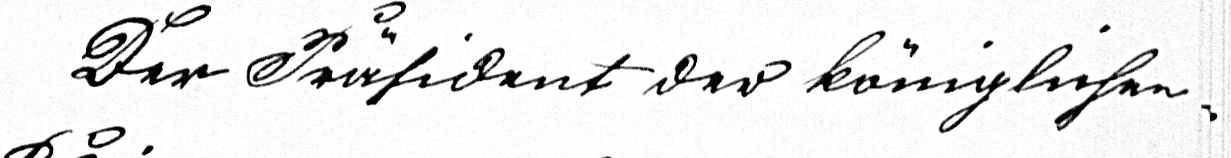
Der Fräsident der königlichen
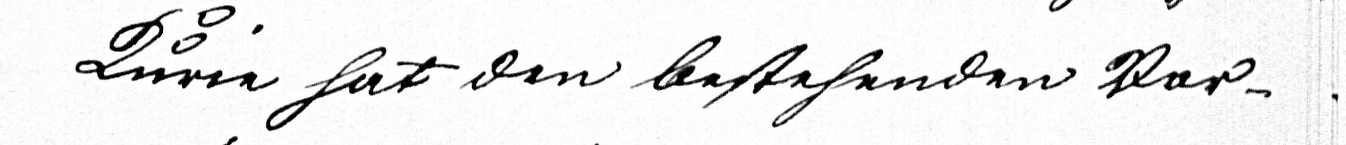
Kurie hat den bestehenden Vor¬
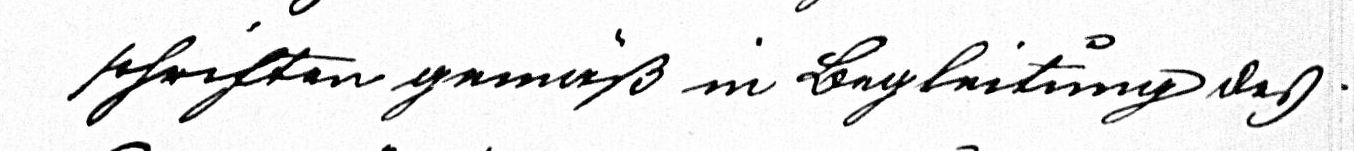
schriften gemäß in Begleitung des
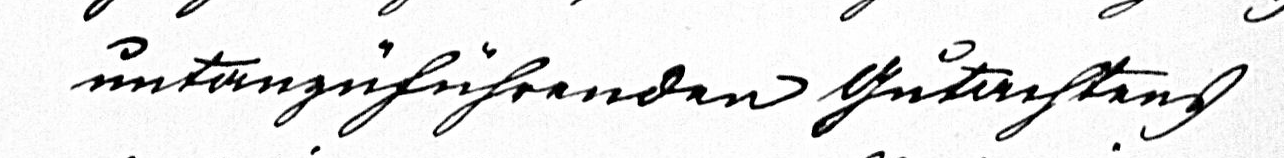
untanzüführenden Gutachtens
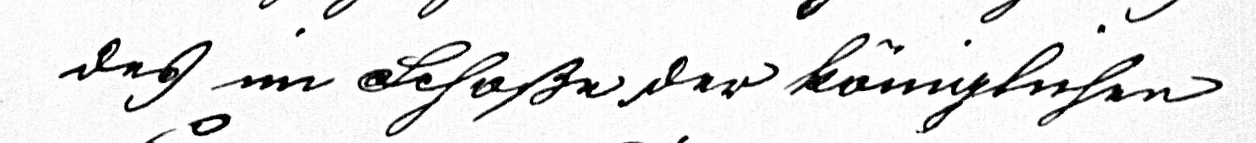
des im Schoße der königlichen
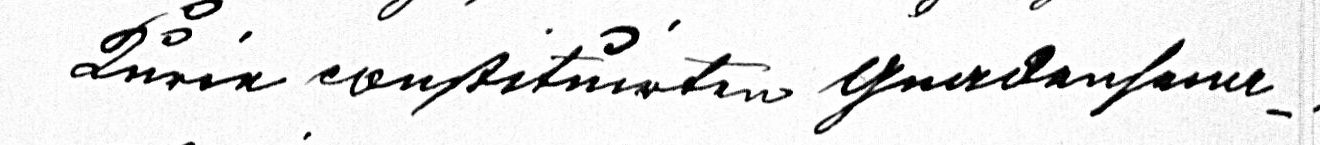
Kurie constituirten Gnadensena¬
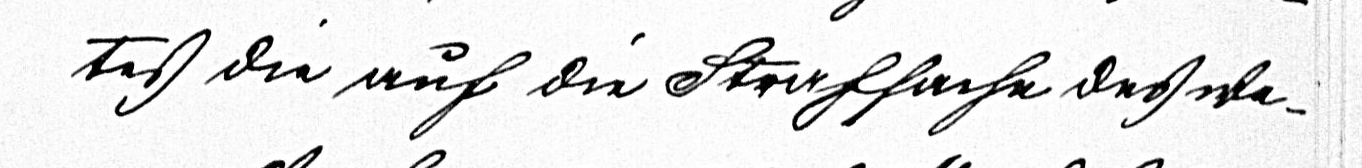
tes die auf die Strafsache des we¬
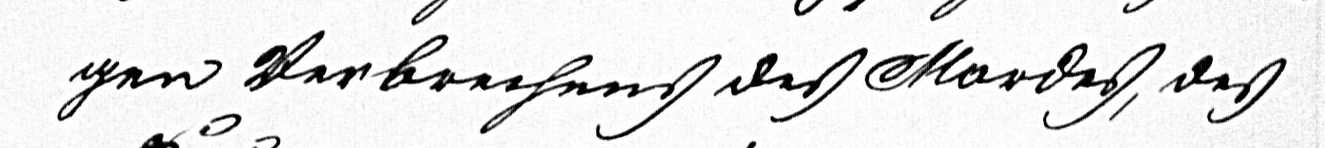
gen Verbrechens des Mordes, des
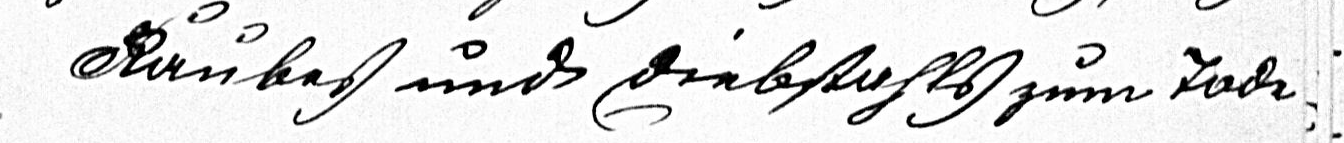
Raubes und diebstahls zum Tode
